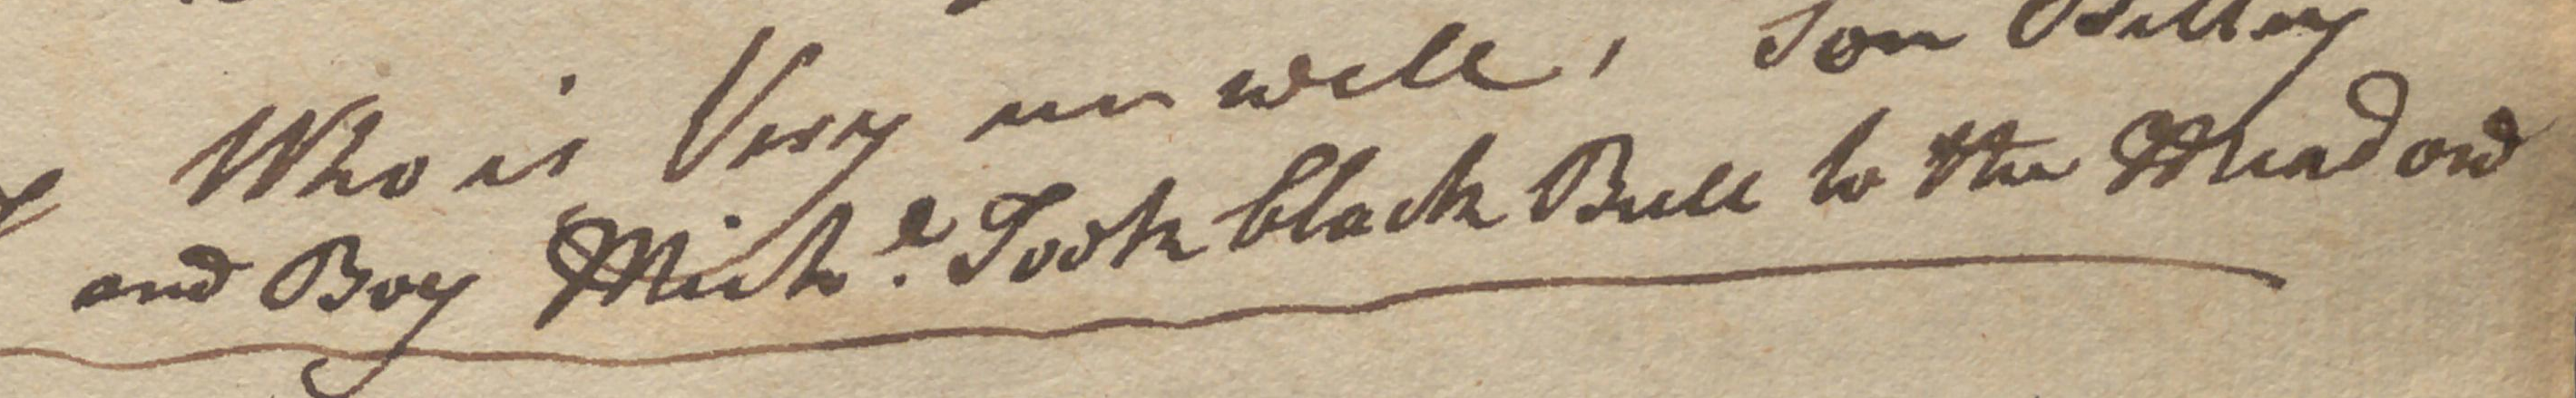and Boy Mich^l. Took black Bull to the Meadow
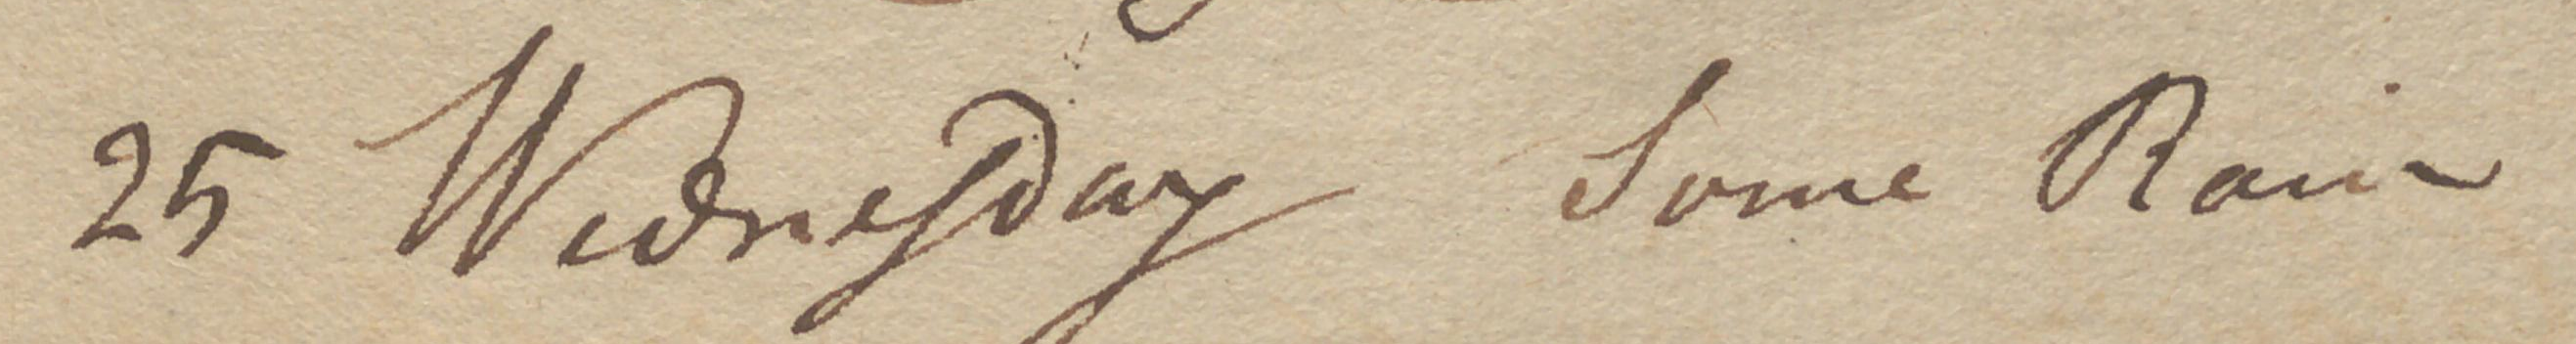25 Wednesday Some Rain
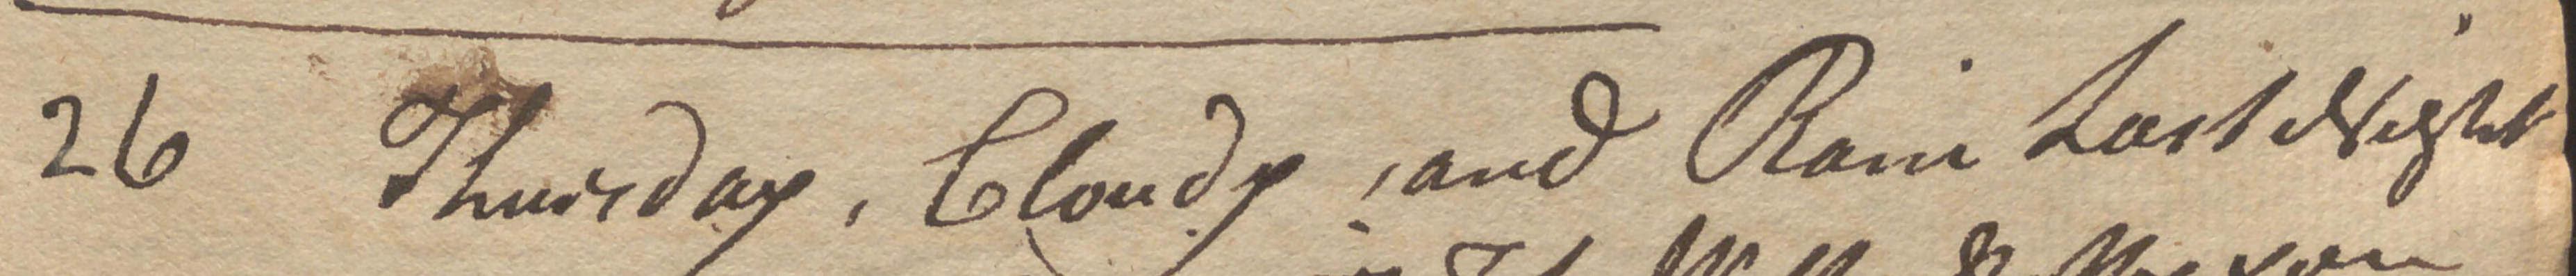26 Thursday. Cloudy and Rain Last Night
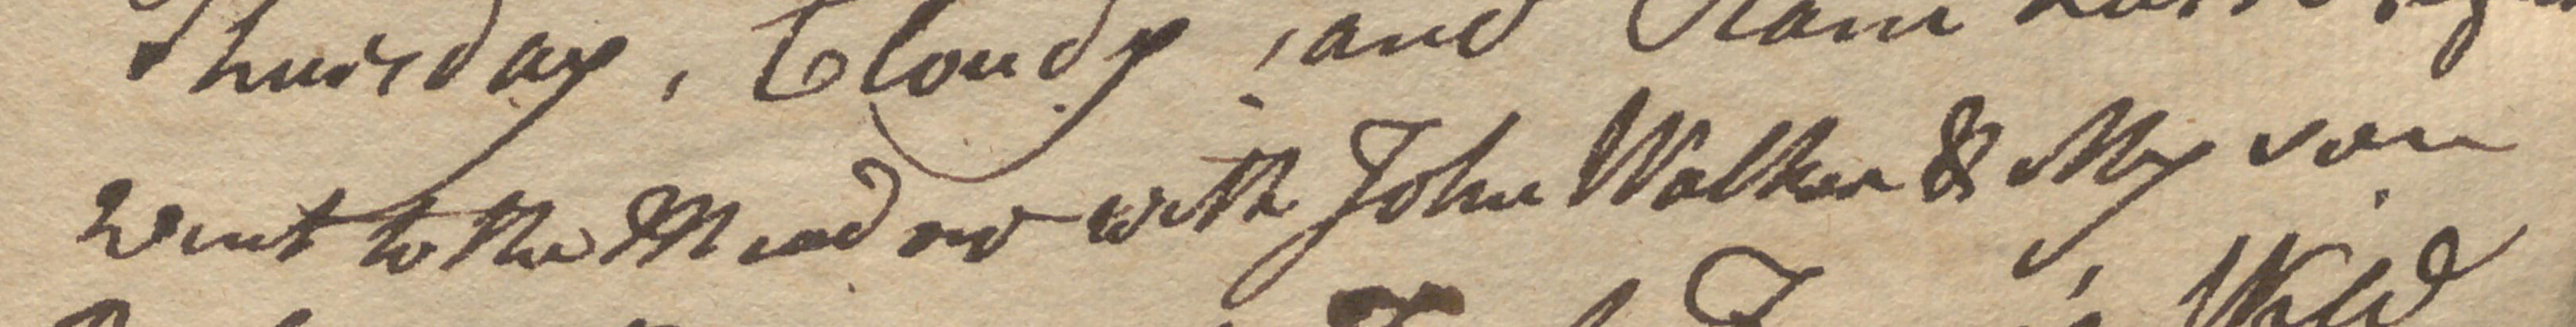went to the Meadow with John Walker & My son
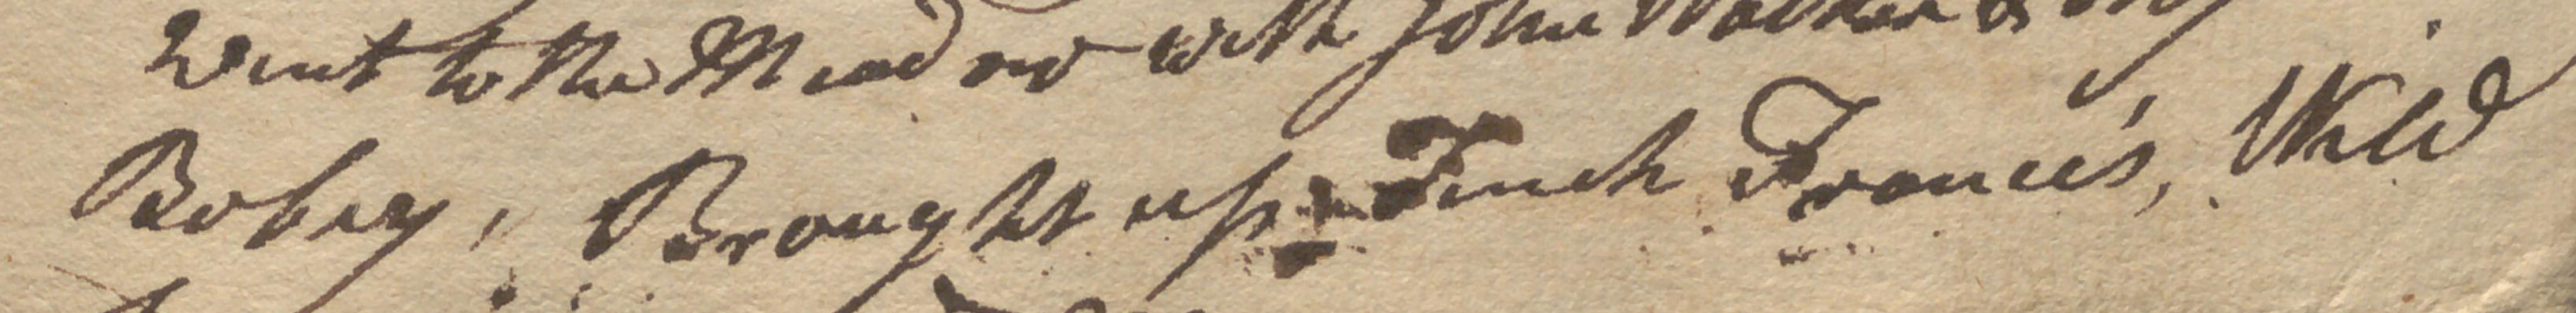Bobey, Brought up Tench Fronces, Wild
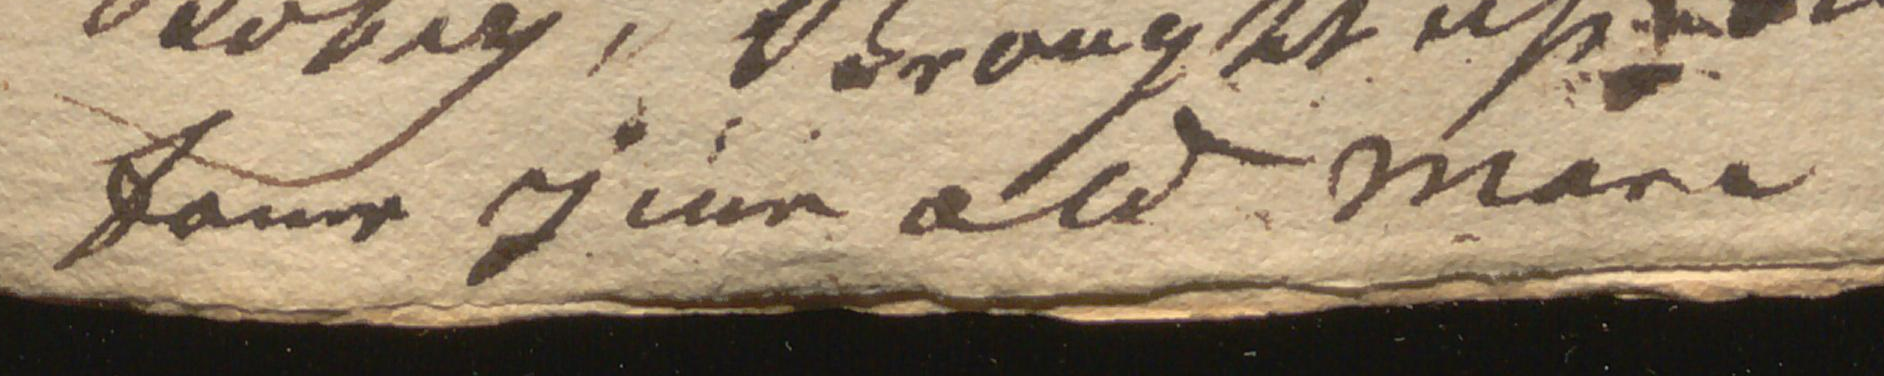four year old mare
